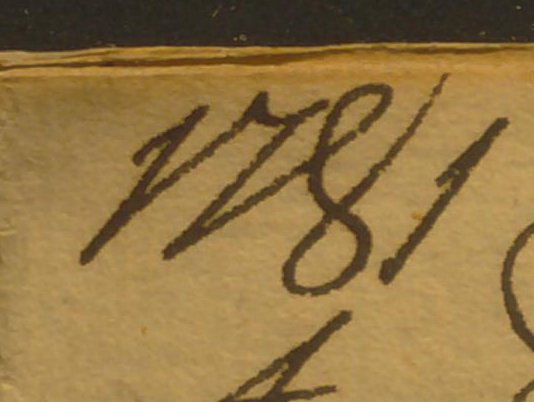1781
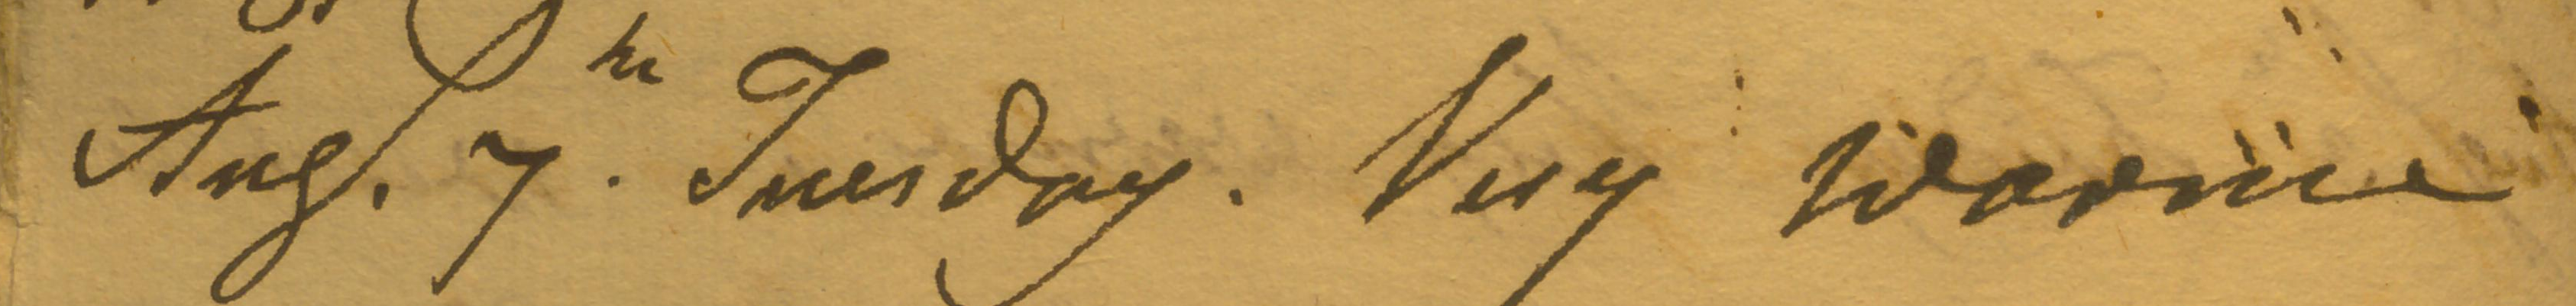Aug^t. 7^th. Tuesday. Very warme
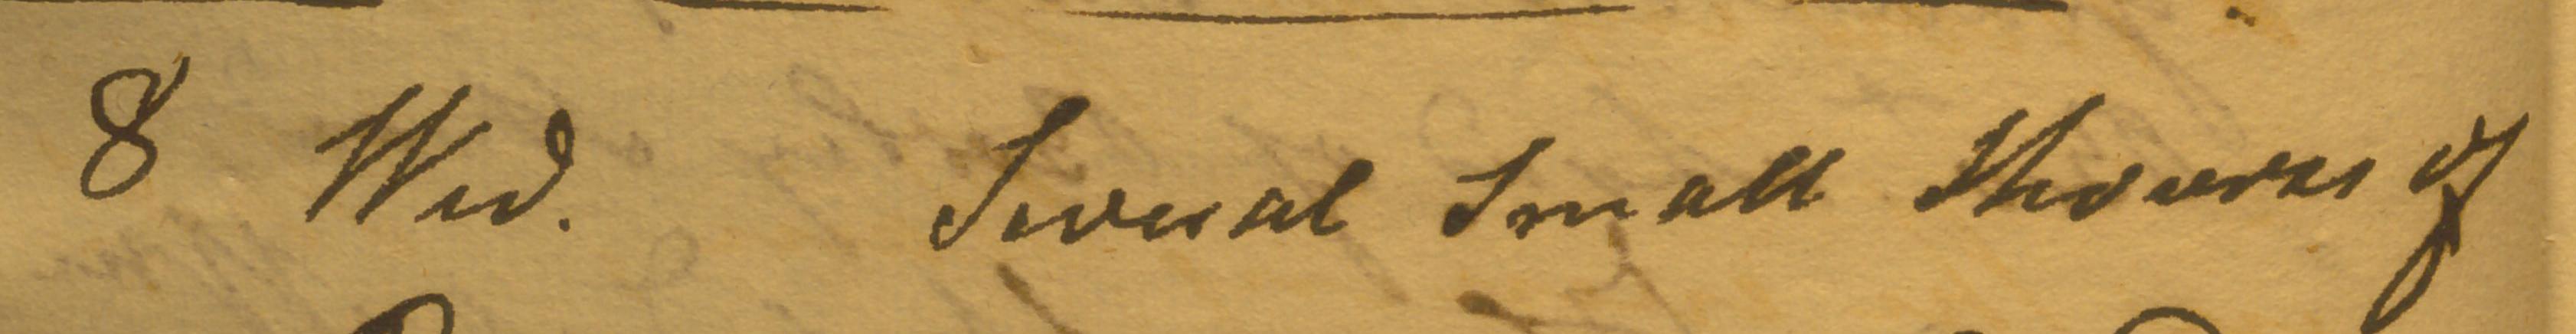8 Wed. Several small Shoures of
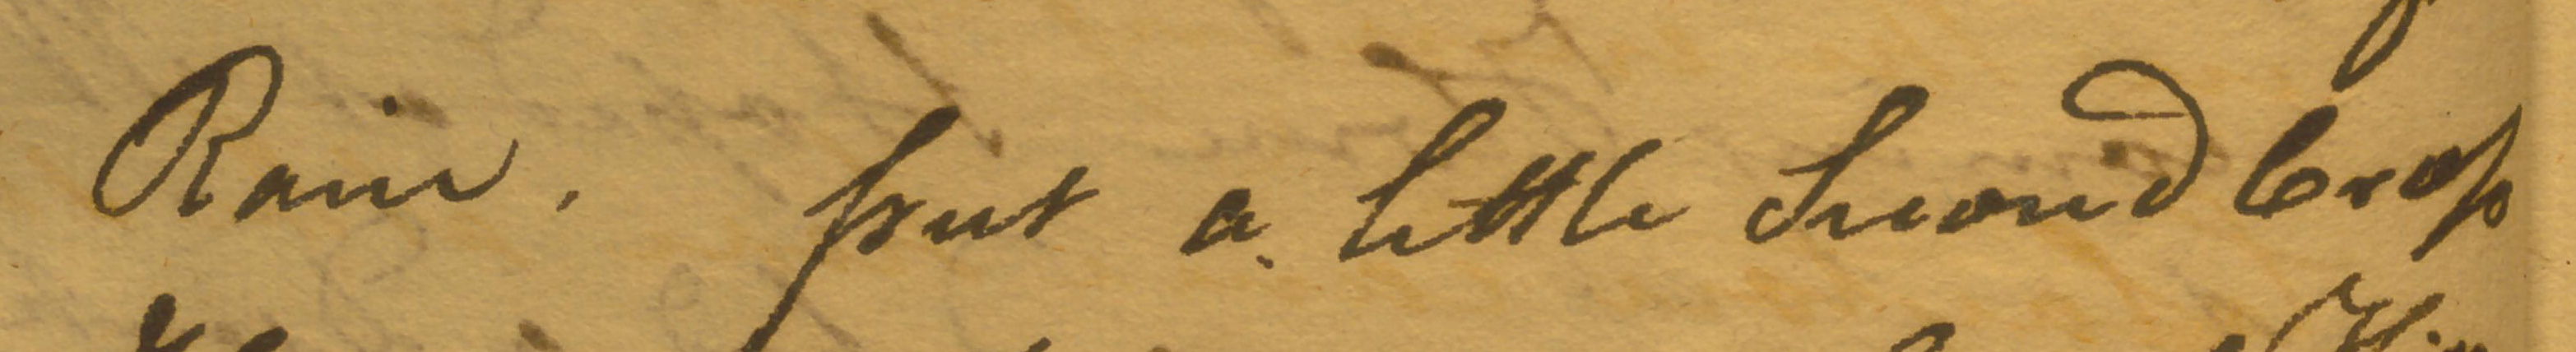Rain. put a little Second Crop
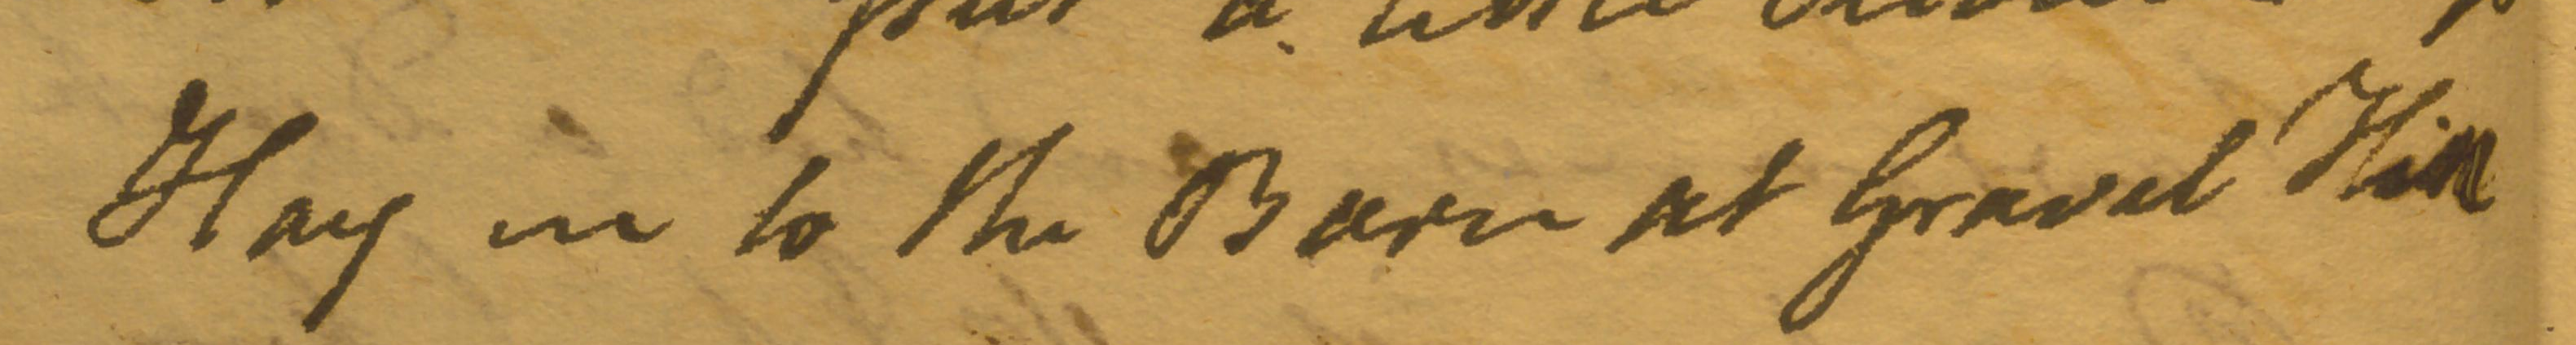Hay in to the Barn at Gravel Hill
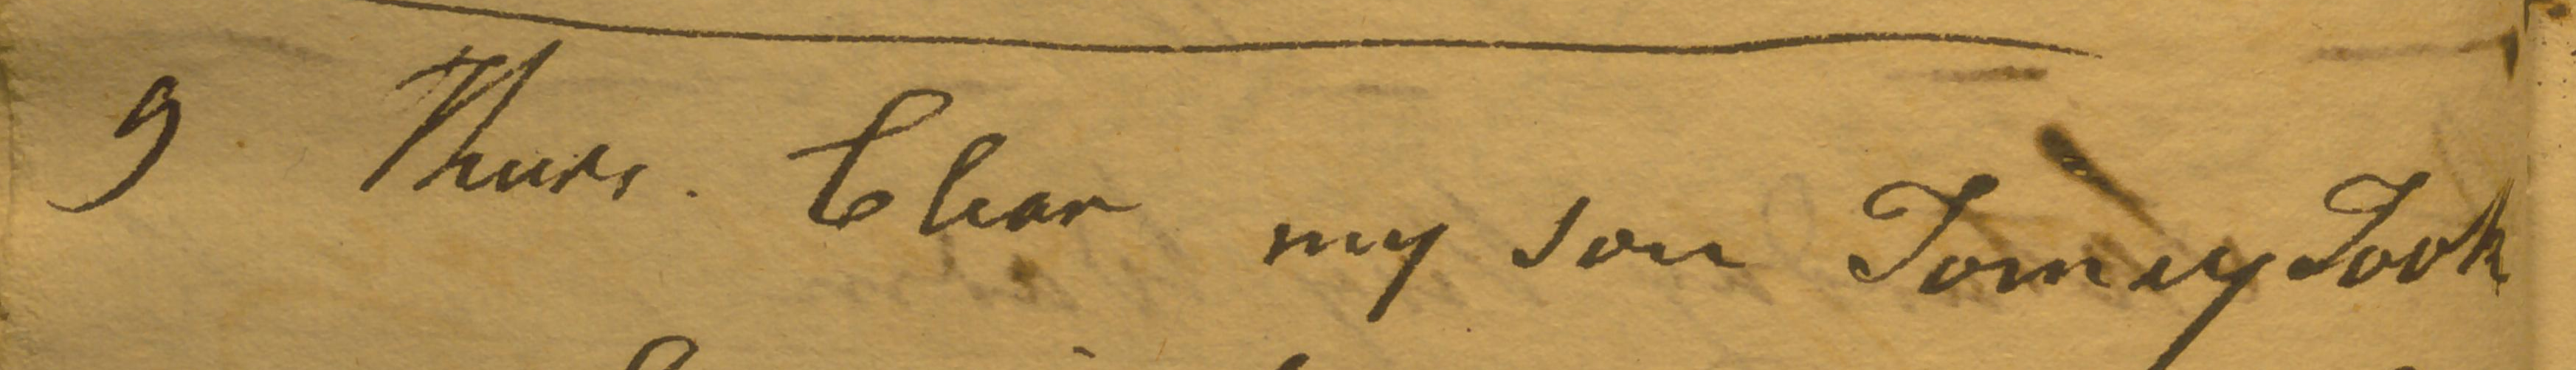9 Thurs. Clear my son Tomey Took
